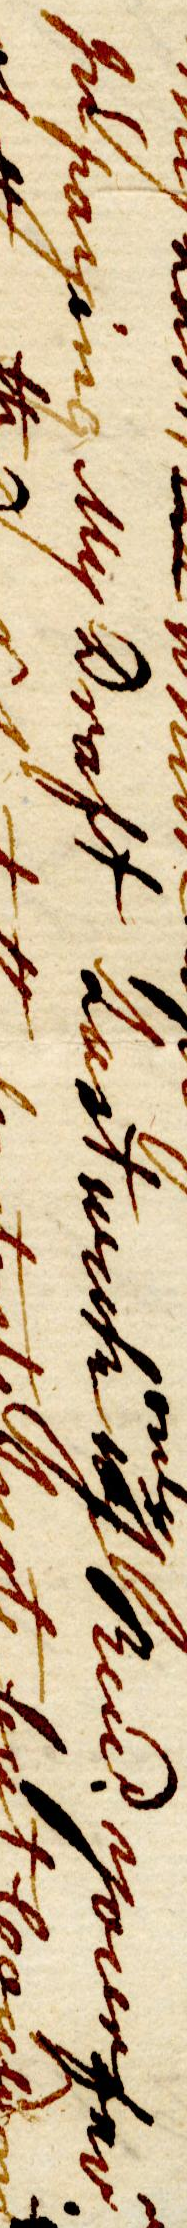In paying My Draft Last week only [__] Rec'd. your fav^r.
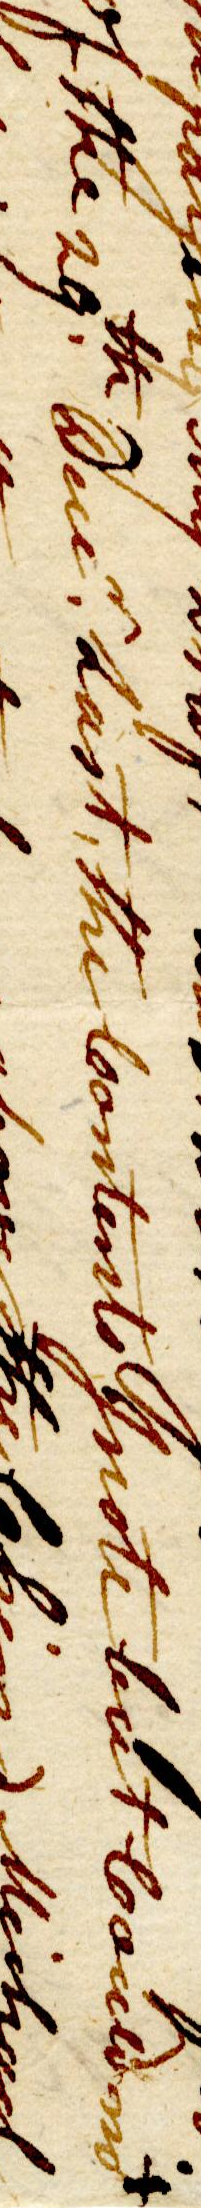of the 29^th. Dece^r. Last, the Contents I note but could not
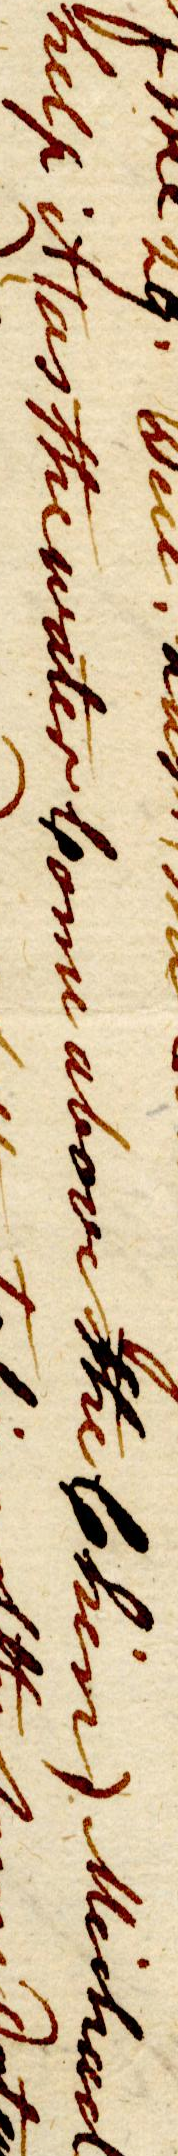help it as the water Come above the Chin) Michael
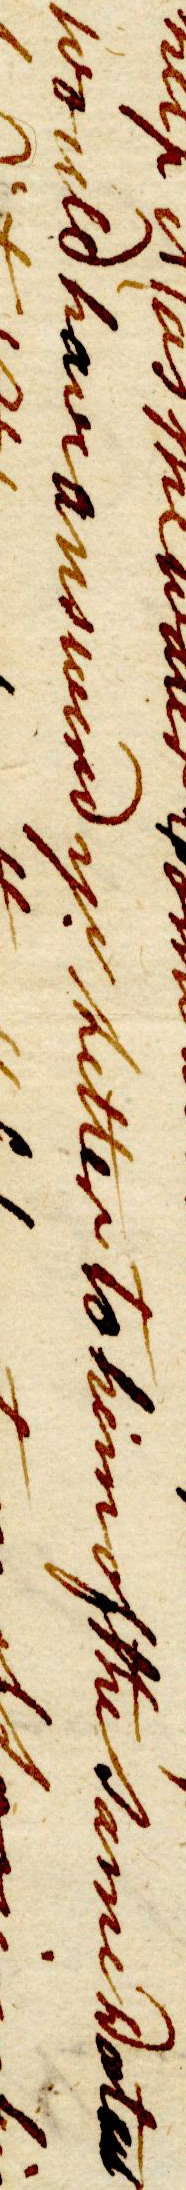would have answerd y^e. Letter to him of the same date
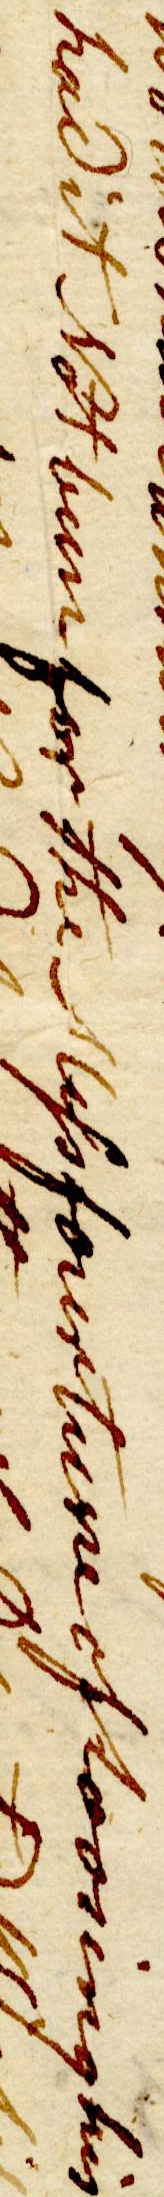had it Not been for the Missfortune of Loosing his
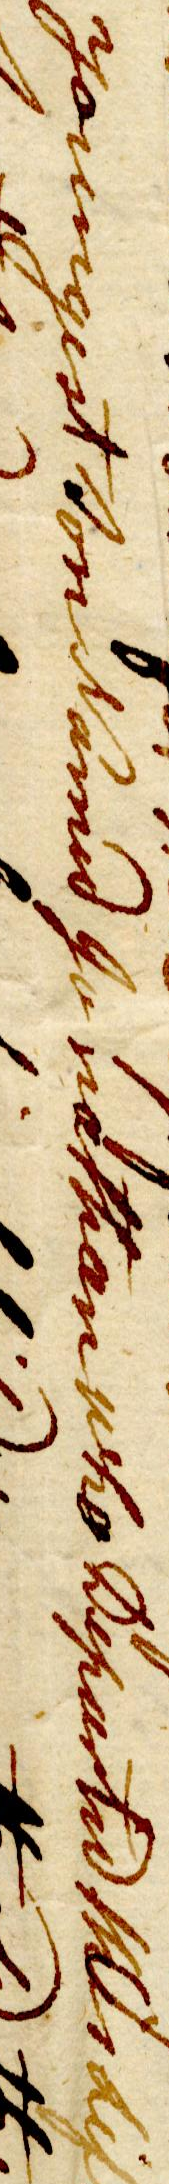youngest son Named Jonathan who Departed his Life
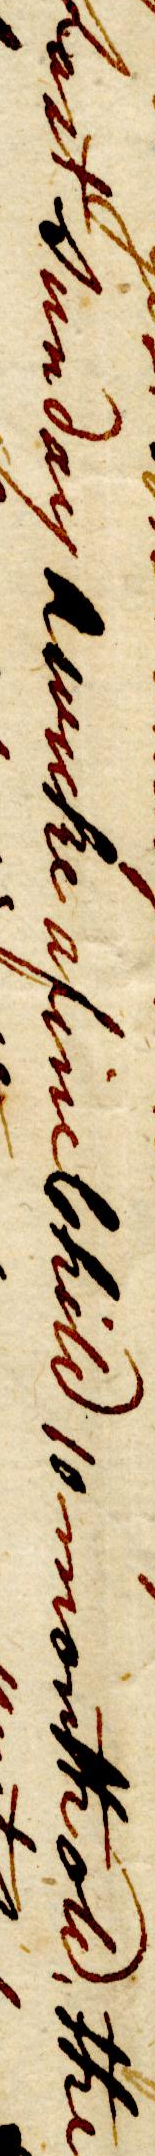last Sunday a weeke a fine Child 10 month old, the
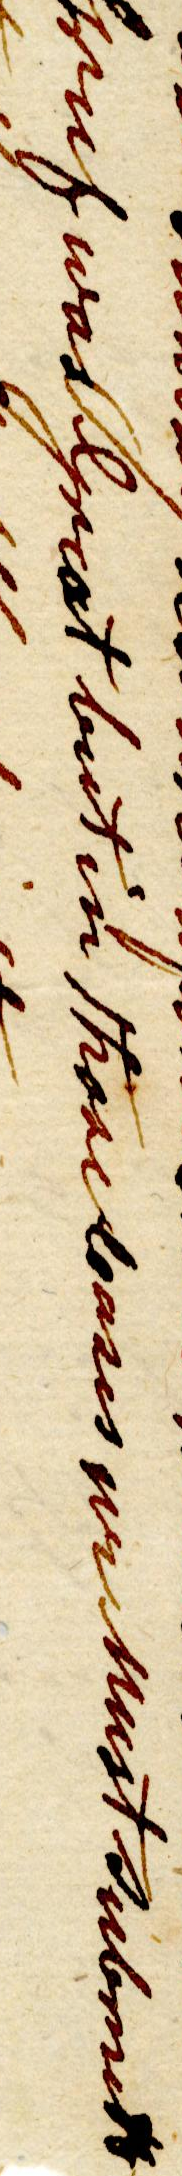Gratz was Great but in those cases we must submitt
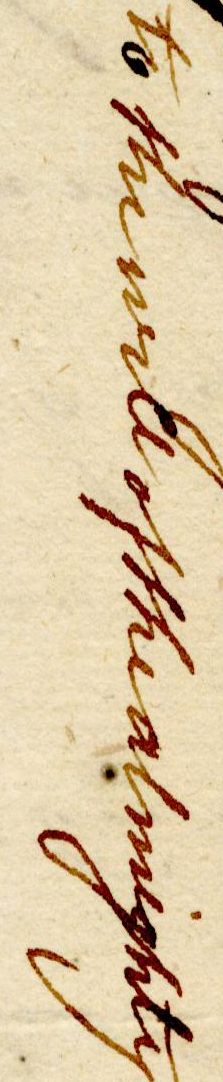to the will of the almighty
